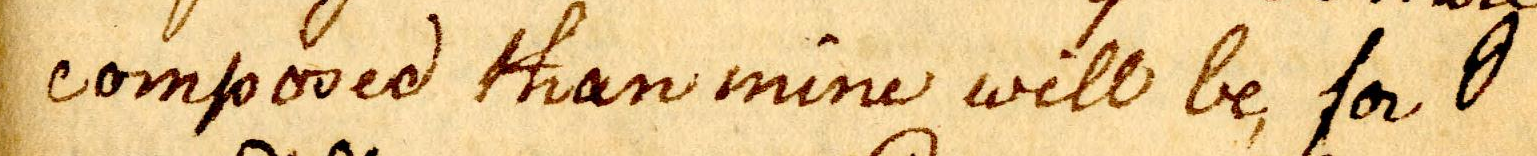composed than mine will be, for I
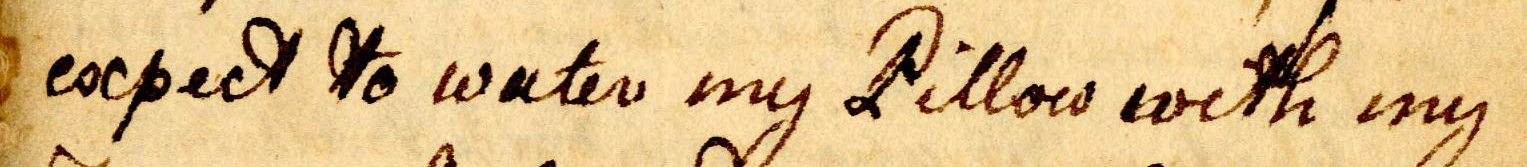expect to water my Pillow with my
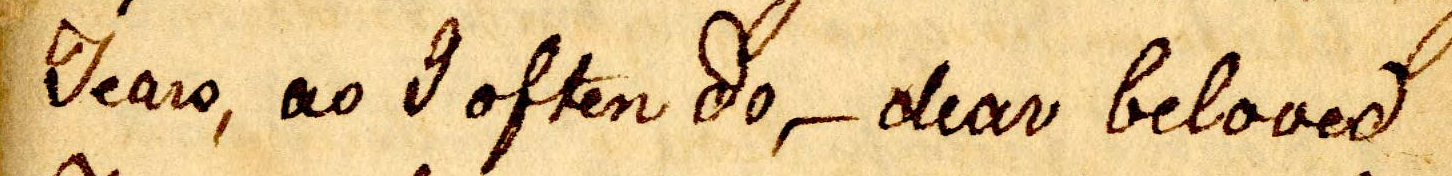Tears, as I often do,- dear beloved
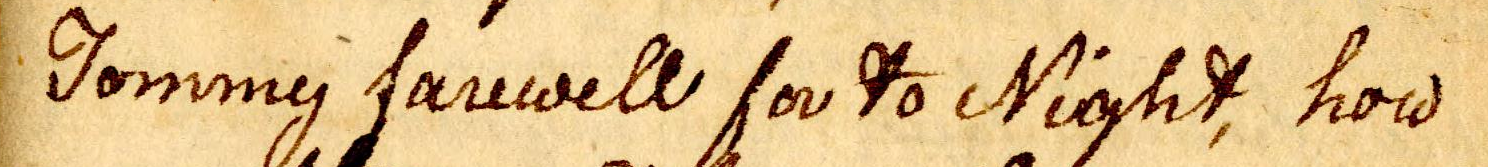Tommy farewell for to Night, how
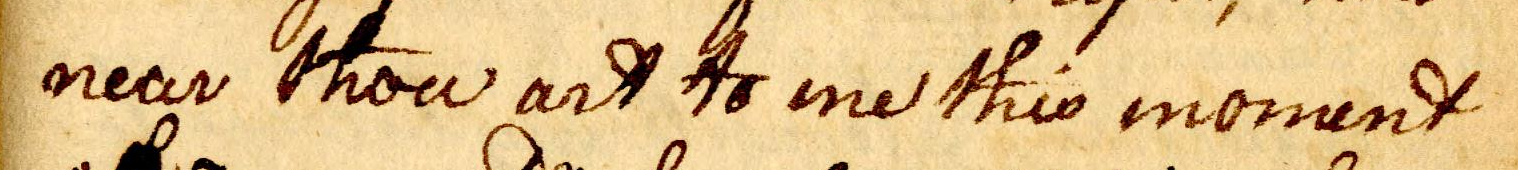near thou art to me this moment
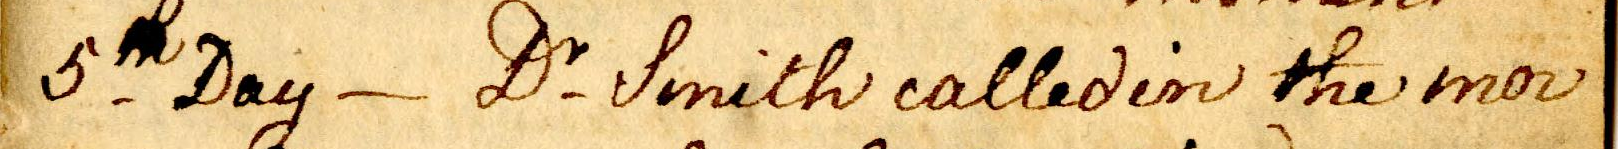5^th Day- D^r Smith called in the mor
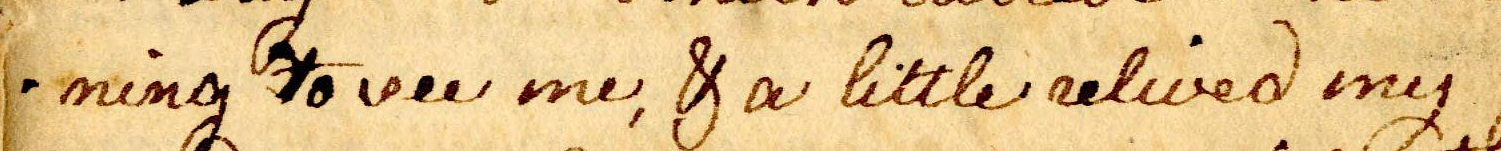-ning to see me, & a little relived my
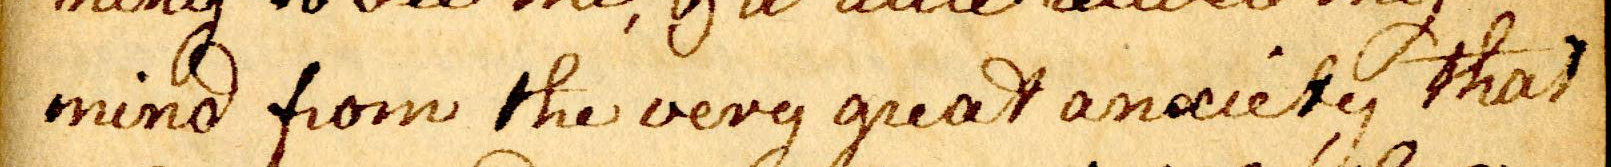mind from the very great anxiety that
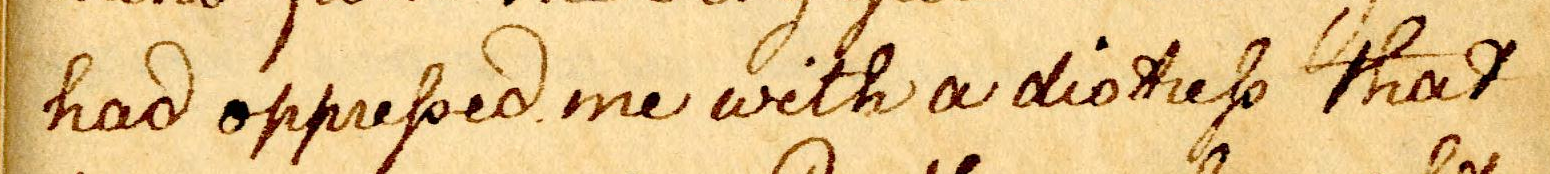had oppressed me with a distress that
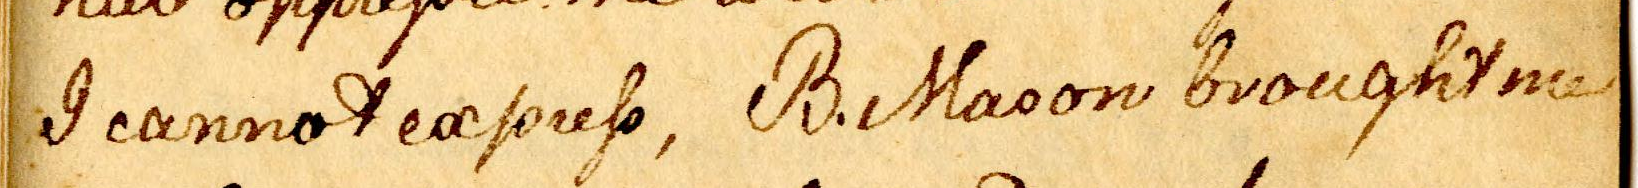I cannot express, B. Mason brought me
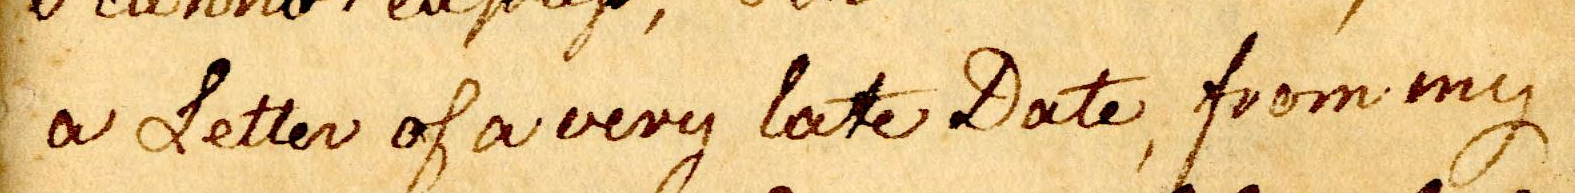a Letter of a very late Date from my
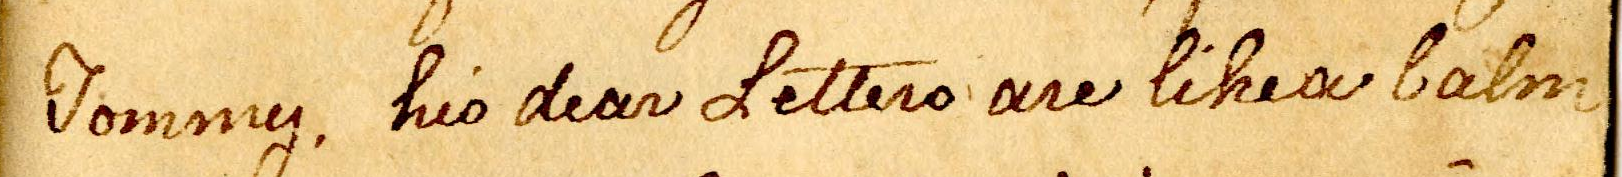Tommy, his dear Letters are like a balm
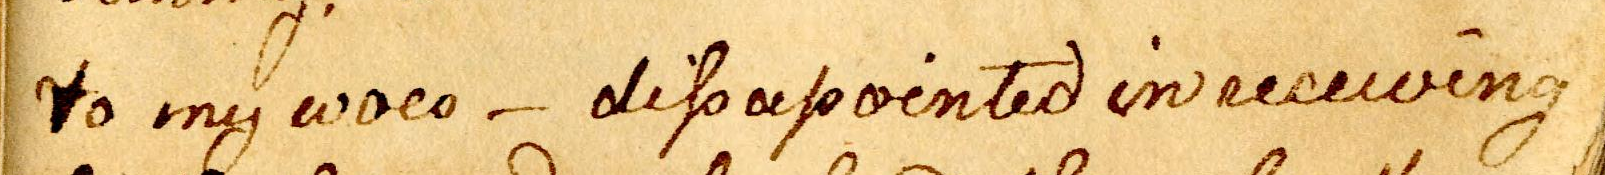to my woes- dissapointed in receiving
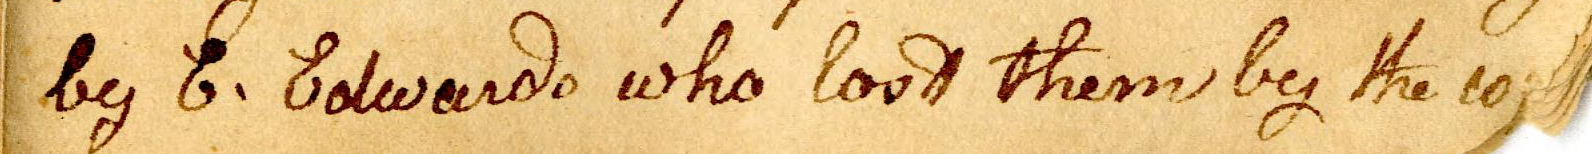by E. Edwards who lost them by the co
